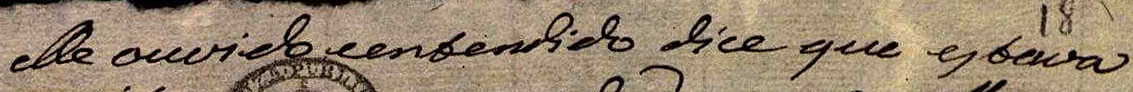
elle ouvido e entendido dice que estava
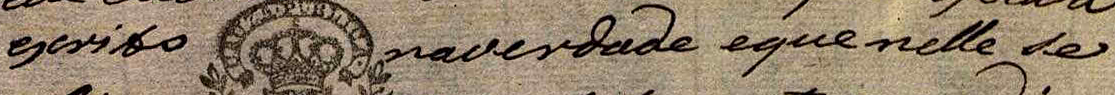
escrito na verdade e que nelle se
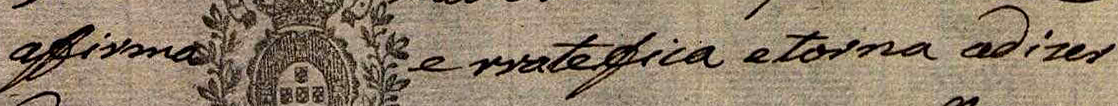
affirma e rratefica e torna a dizer
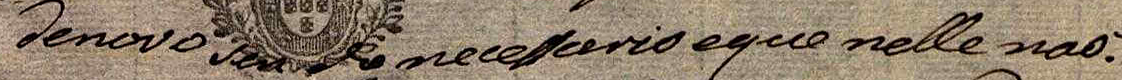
de novo sendo necessario e que nelle naõ
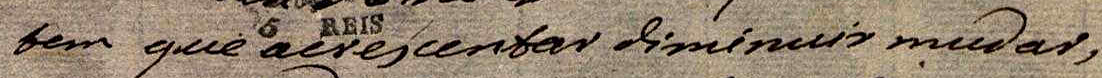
tem que acrescentar diminuir mudar,
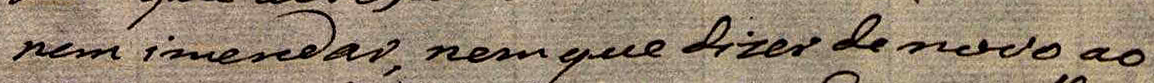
nem imendar, nem que dizer de novo ao
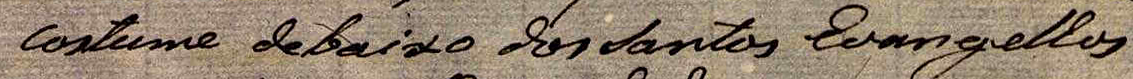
costume debaixo dos Santos Evangelhos
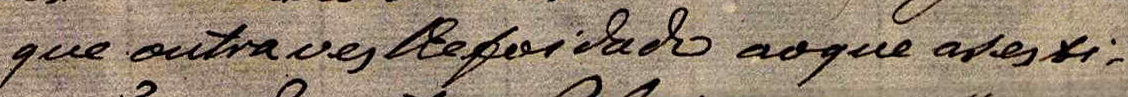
que outra ves lhe foi dado ao que asesti
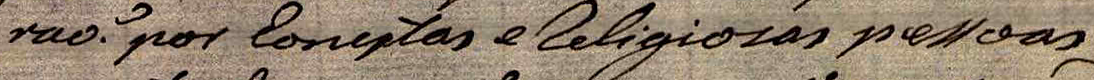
raõ por honestas e Religiozas pessoas
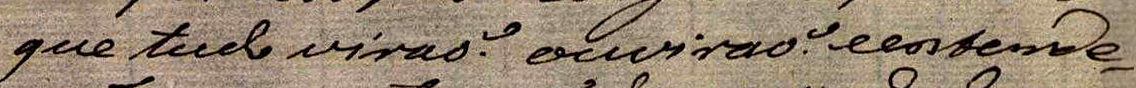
que tudo viraõ ouviraõ e entende
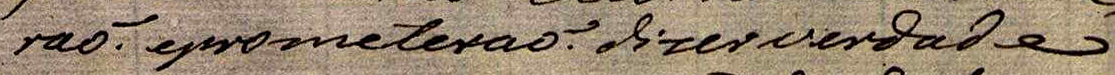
raõ e prometeraõ dizer verdade
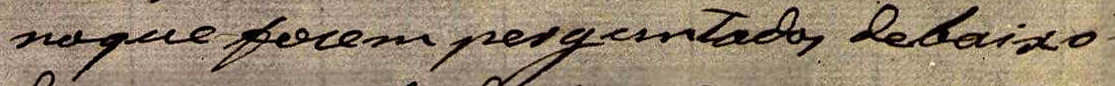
no que focem perguntados debaixo
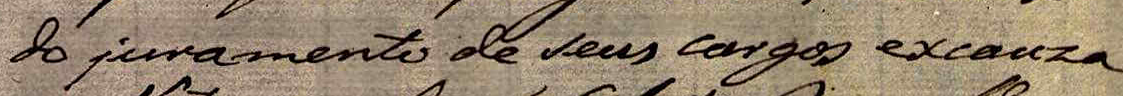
do juramento de seus cargos excauza
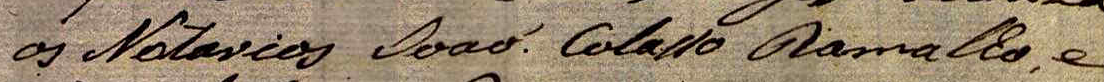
os Notarios Ioaõ Colasso Ramalho, e
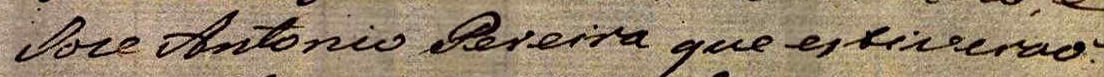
Ioze Antonio Pereira que estiveraõ
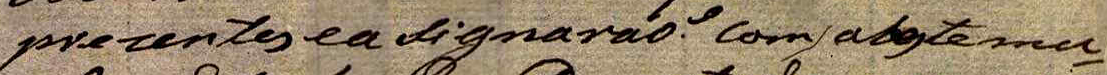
prezentes e asignaraõ com a testemu
